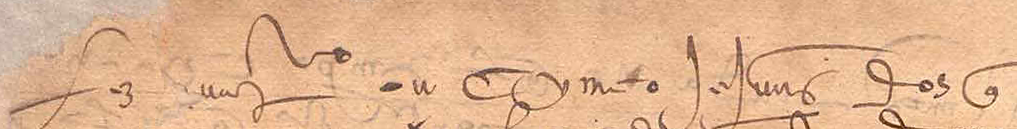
fez _uatro ou cymco JeJūus dos q̄
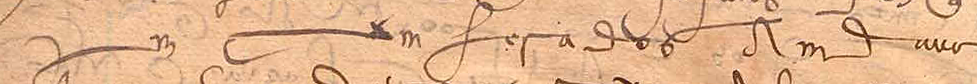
tem Comfesados Amdaua
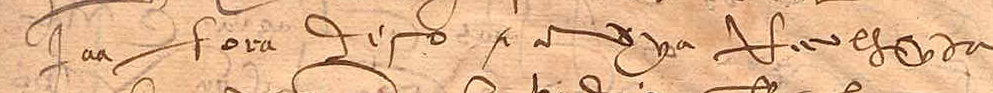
Jaa fora diso e aꝟya Recolheyta
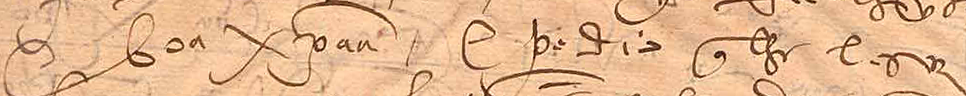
e boa Xp̄aa / e pedio q̄ lhe lesem
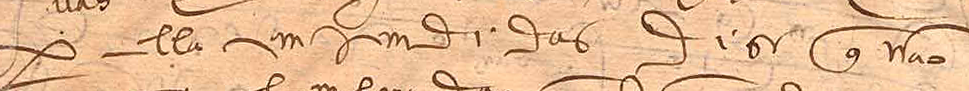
ꝑ ella emtemdidas dise q̄ não
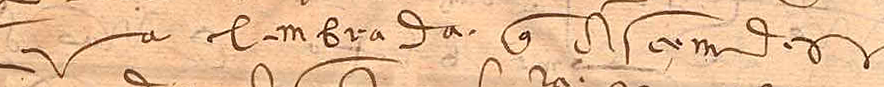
era lembrada q̄ Ascemdese
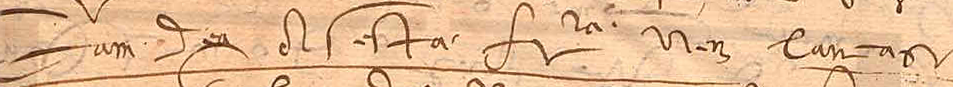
camdea A sesta frra nem lancase
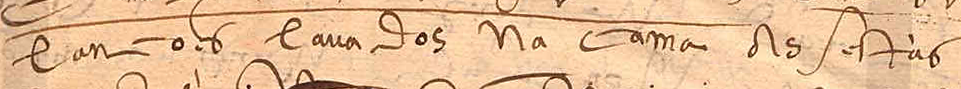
lançoes lauados na cama As sestas
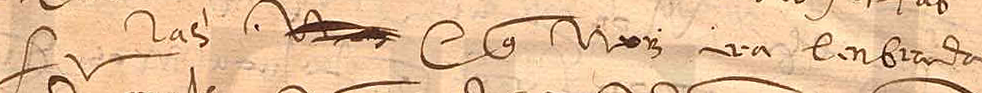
frras _ e q̄ nom era lembrada
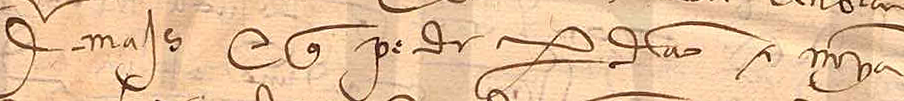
de maJs e q̅ pede ꝑdão e mȳa
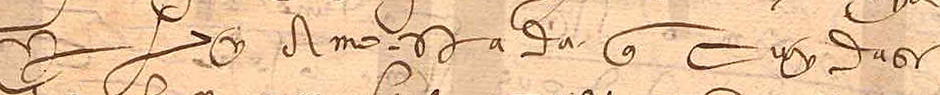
e foy Amoestada q̄ cuydase
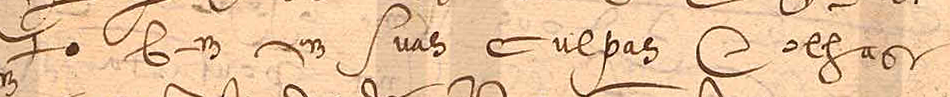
mto bem em Suas culpas e olhase
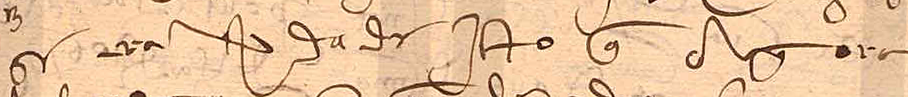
se era ꝟdade Jsto q̄ Agora
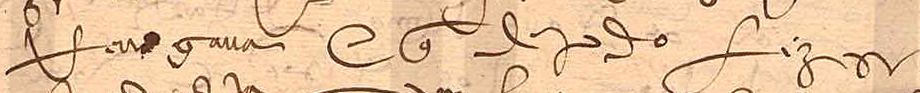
Reuogaua e q̄ de todo fizese
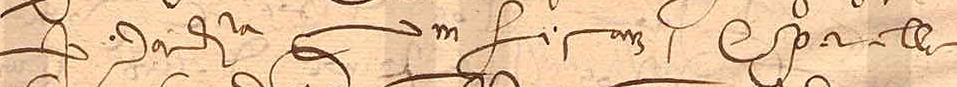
ꝟdadra Comfisam / e por ella
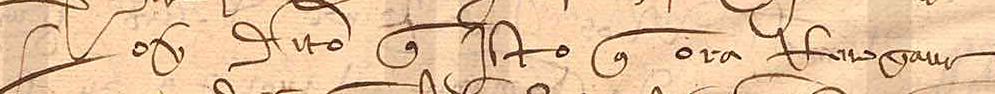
foy dīto q̅ Jsto q̅ ora Reuogaua
